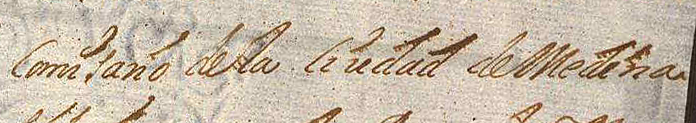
Comisario de la Ciudad de Medina
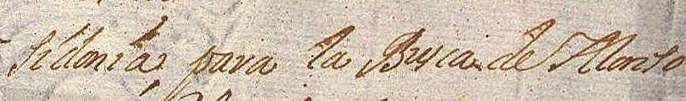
Sidonia, para la Busca de Alonso
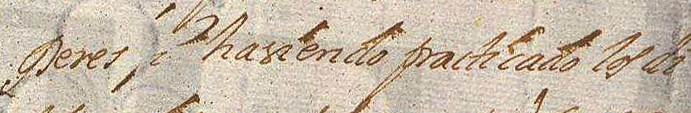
Peres, i haviendo praticado las di
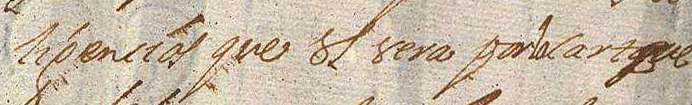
ligencias que V S vera por la carta que
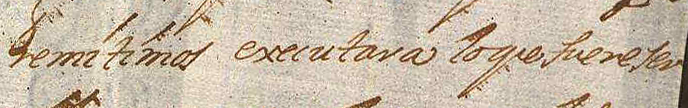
remitimos executara lo que fuere ser
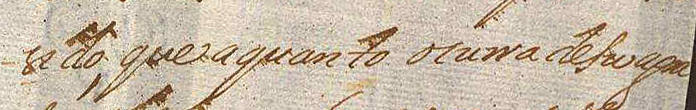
vido, que a quanto ocurra de su agra
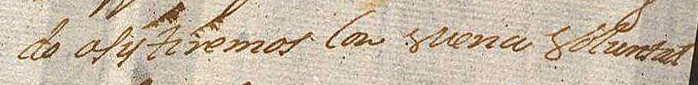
do asistiremos Con vuena Voluntad
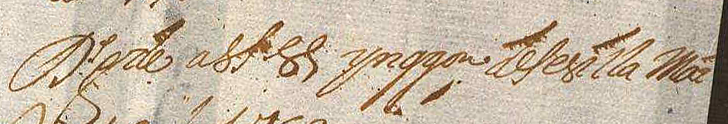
Ds. gde a VS VS ynqqon de Sevilla Mai
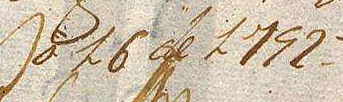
o 16 de 1752.
